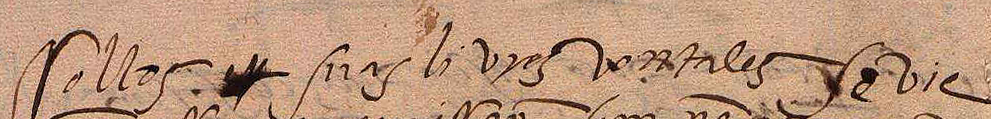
ssoltos e ꝑ suas livres vontades se vie
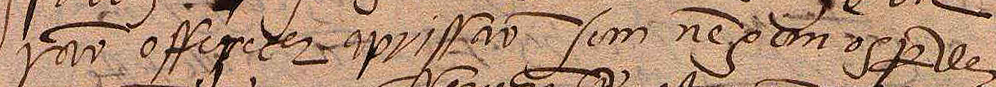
rão offereçer a prissaõ sem nēgem os ꝑ̄der
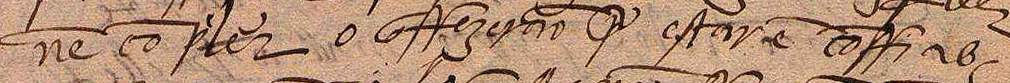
nē cōpter o q̄ ffezerão p̄o estarē cōffiados
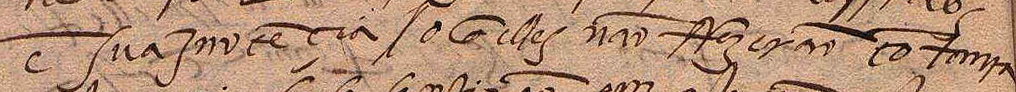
ē sua Jnocēçia / o q̄ elles não ffezerão c̄o tanta
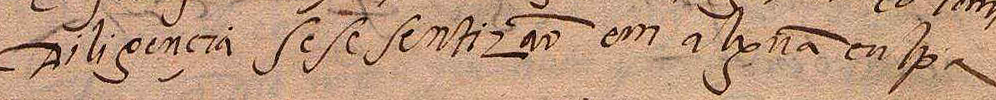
Diligençia se se sentirão em algūa culpa
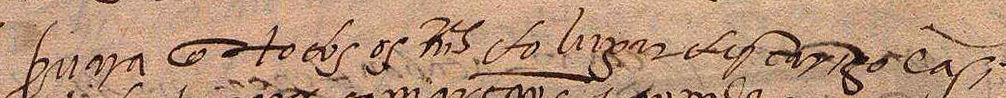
ꝓuara q̄ todos os mres do lugar descarigo e asi
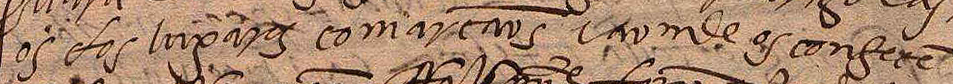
os dos lugares comarcãos e aomde os conheçē
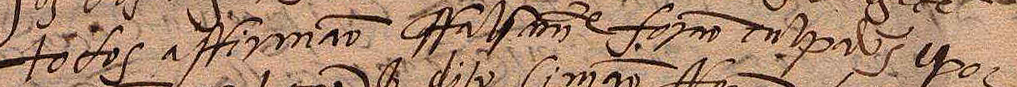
todos affirmão ffalsamte foraõ culpados e por
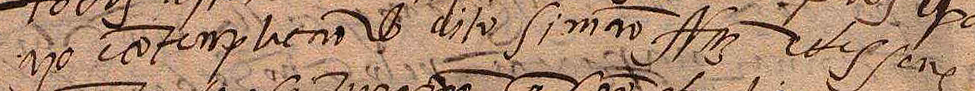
azo ē cōtenplacaõ do dito simão ffrz̄ e dos seus
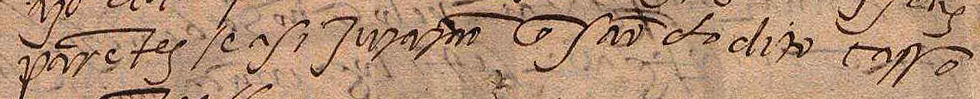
parētes / e asi Juraraõ q̄ saõ do dito casso
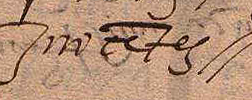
Jnocētes //
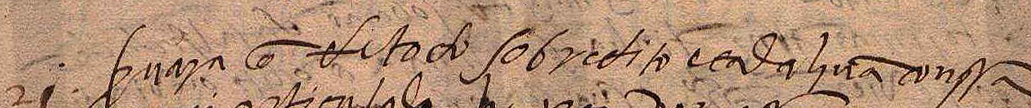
2j. ꝓuara q̄ de todo sobredito e cada huā coussa
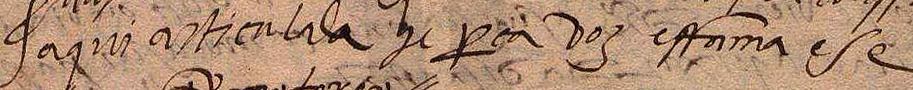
aqui articulada he ꝓca voz e ffama e se
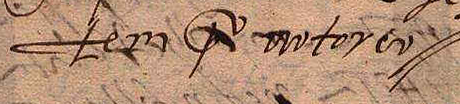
tem p̄o notorio //
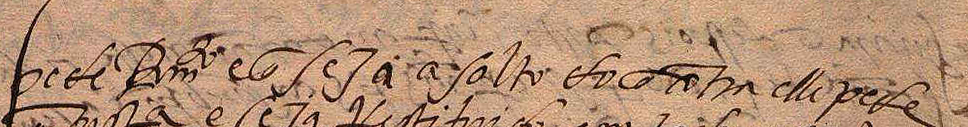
pede Rmto e q̄ seJa asolto do q̄ cōtra elle pede
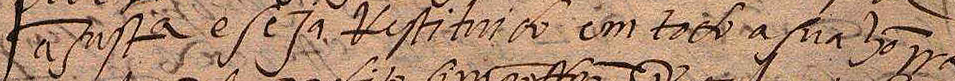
a Justa e seJa Restituido em todo a sua hōrra
